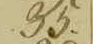35.
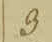3
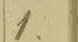1.
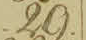29.
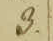3.
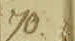70.
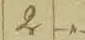2
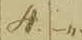4.
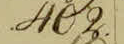402.
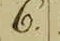6.
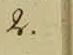2.
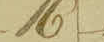16
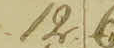12.
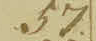57.
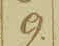9.
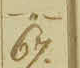67.
